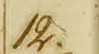12.
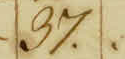37.
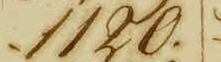1120.
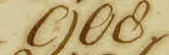908.
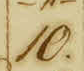10.
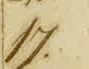17.
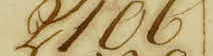2106.
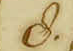8.
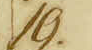19.
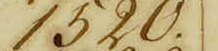1520.
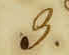3.
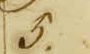5.
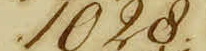1028.
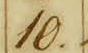10.
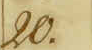20.
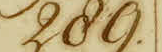289.
